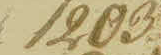1203
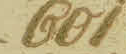601
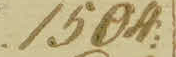1504.
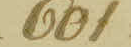601
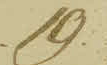19.
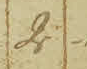2
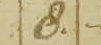8.
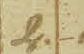2.
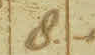8.
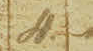4.
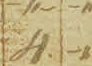4.
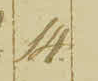14
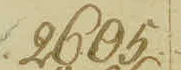2605
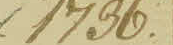1736.
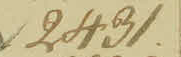2431.
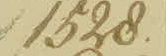1528.
